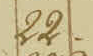22
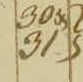31
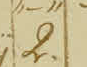2.
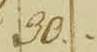30.
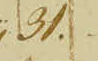31.
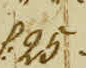25
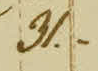31.
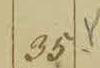35
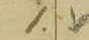1.
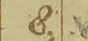8.
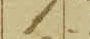1
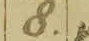8.
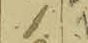1.
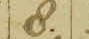8.
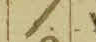1.
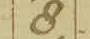8
